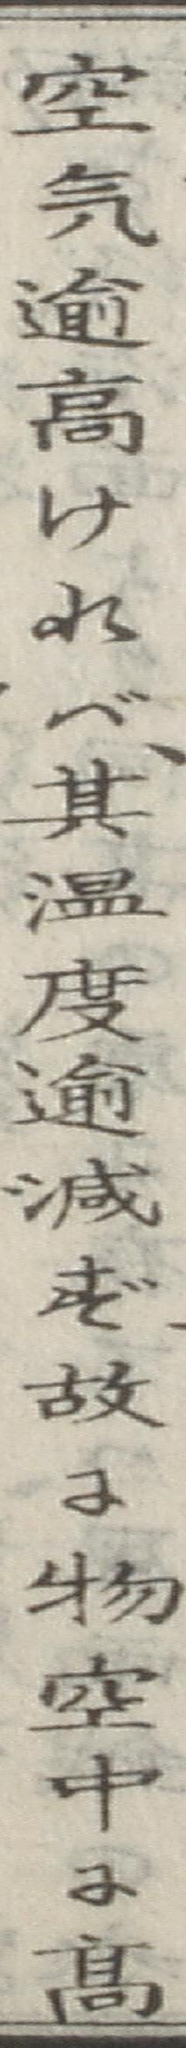空気愈高ければ、其温度愈減ず、故に物空中に高
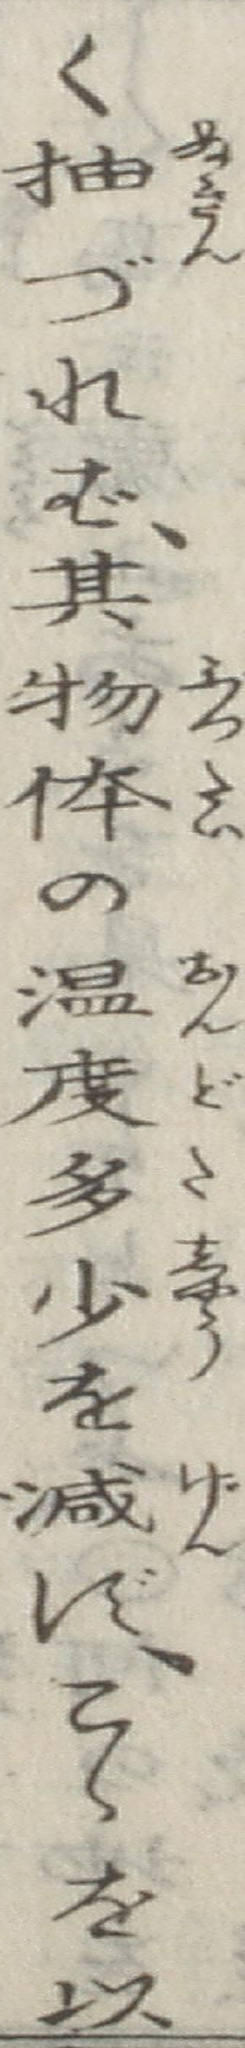く抽づれば、其物体の温度多少を減ず、こゝを以
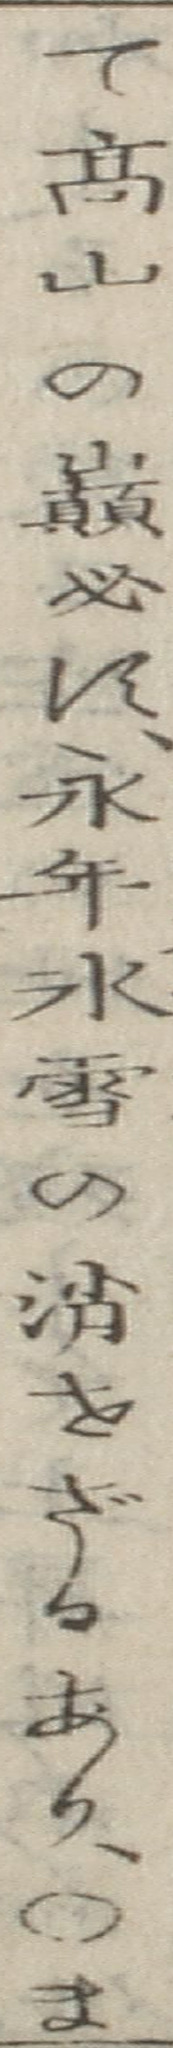て高山の巓必す、永年氷雪の消せざるあり、〇ま
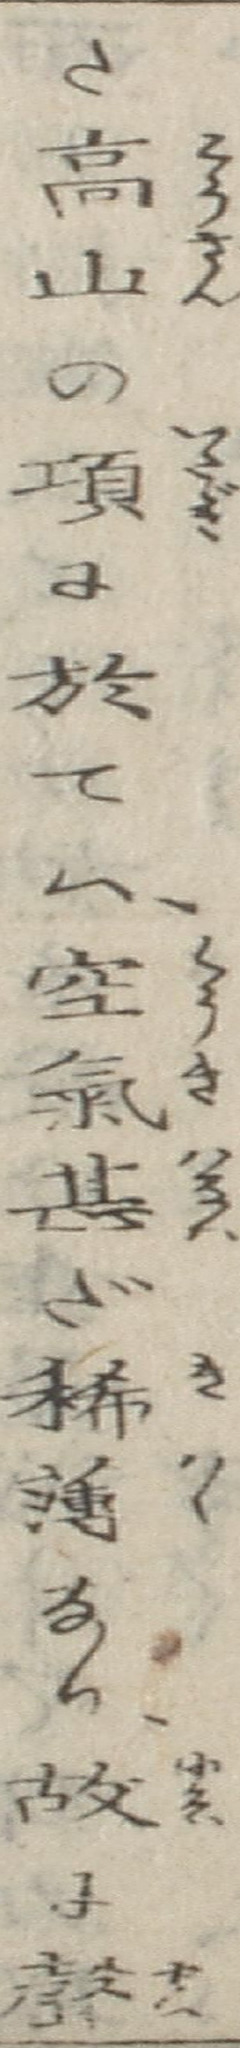た高山の頂に於ては、空気甚だ稀薄なり、故に聲
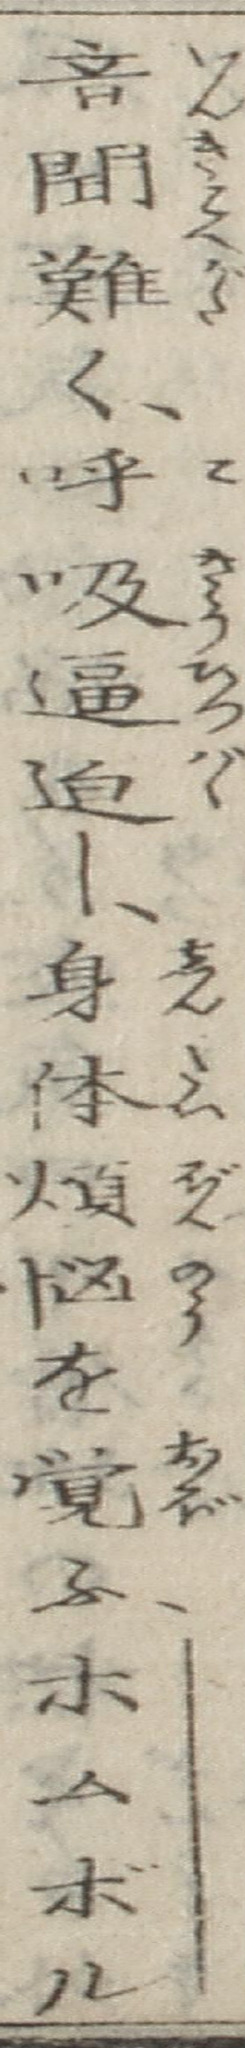音聞難く、呼吸逼迫し、身体煩悩を覚ふ、ホムボル
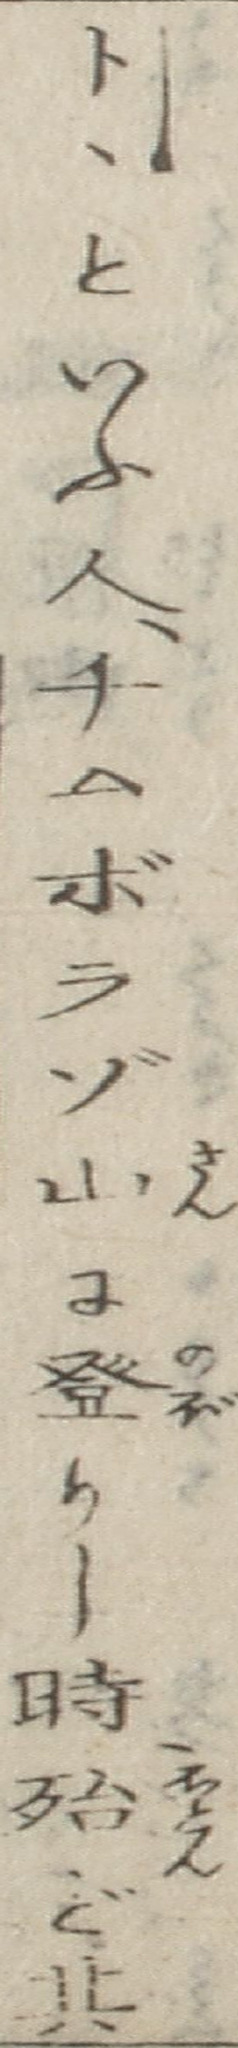ト、といふ人、チムボラゾ山に登りし時、殆ど其
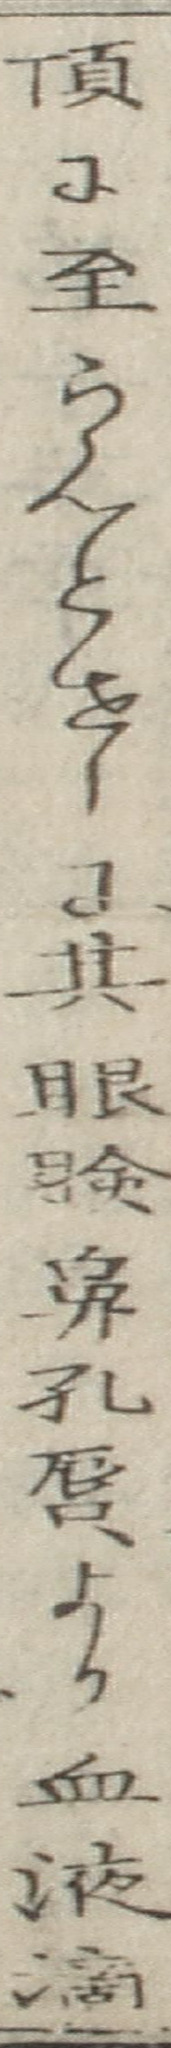頂に至らんとせしに、其眼瞼鼻孔唇より血液滴
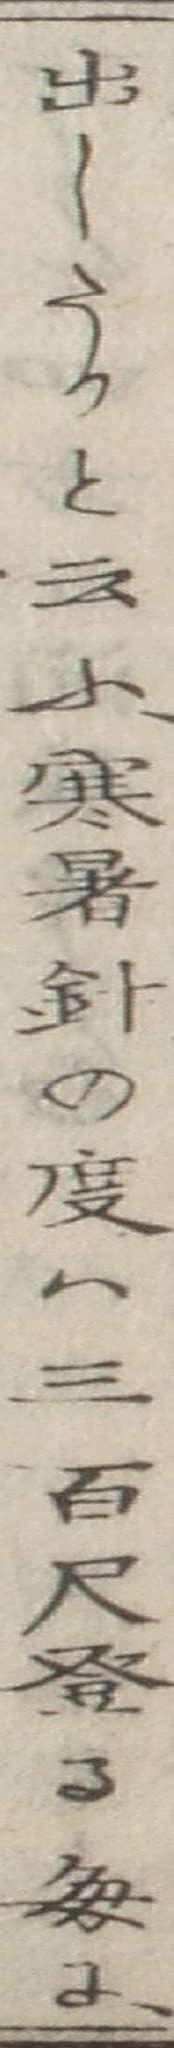出したりと云ふ、寒暑針の度は三百尺登る毎に、
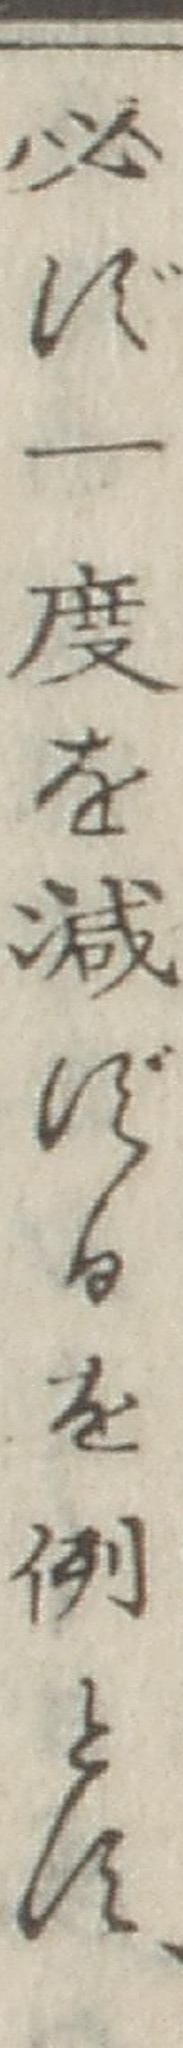必ず一度を減ずるを例とす、
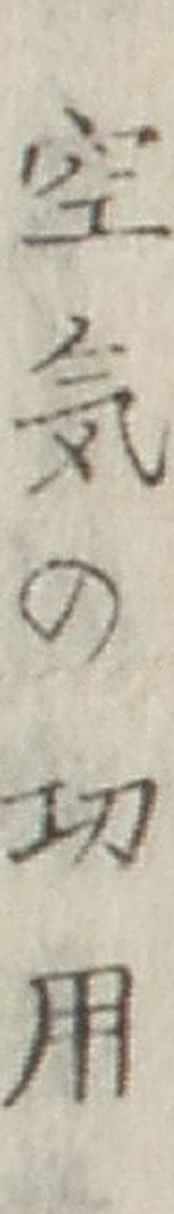空気の功用
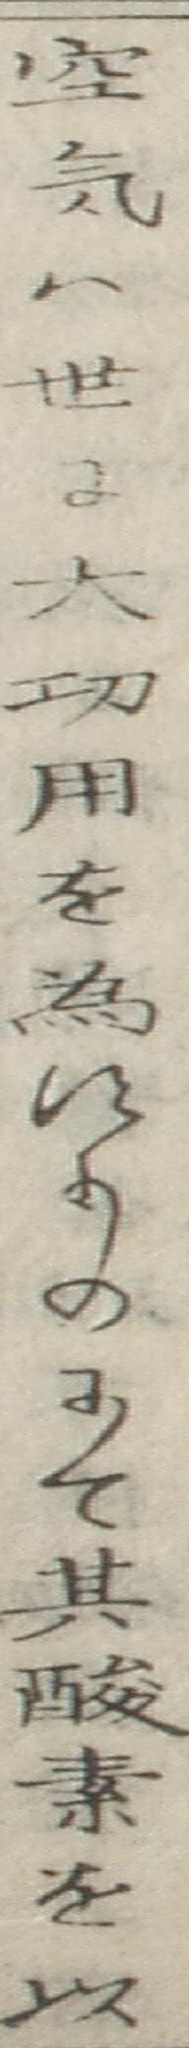空気は世に功用を為すものにて其酸素を以

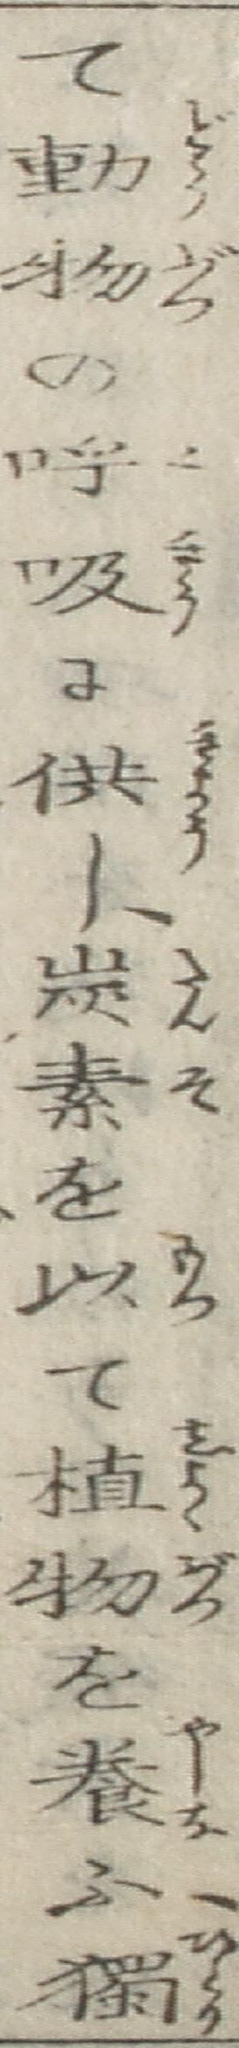て動物の呼吸に供し、炭素を以て植物を養ふ、独
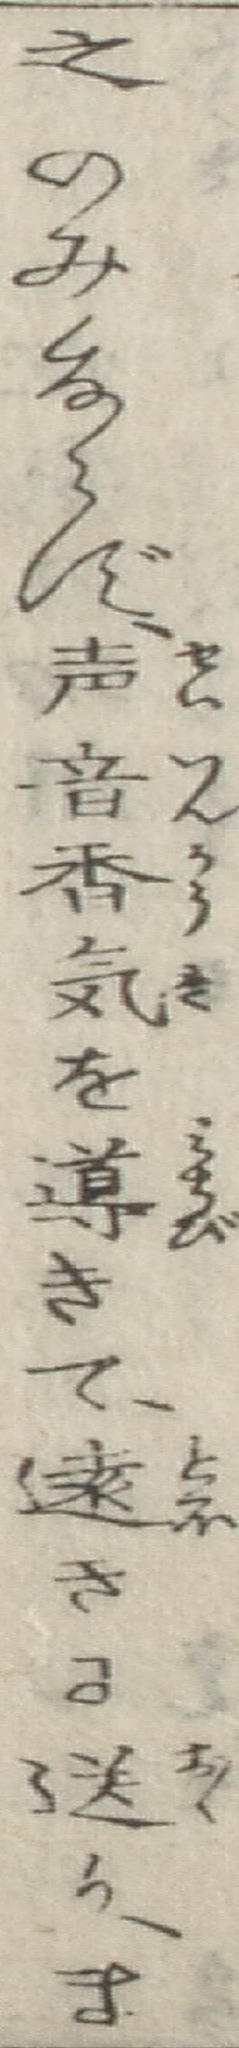之のみならず、声音香気を導きて、遠きに送り、ま
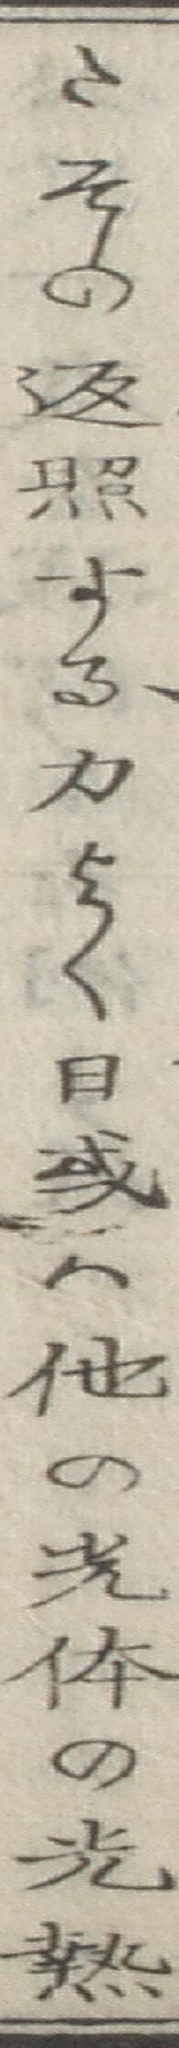たその返照する、力よく日或は他の光体の光熱
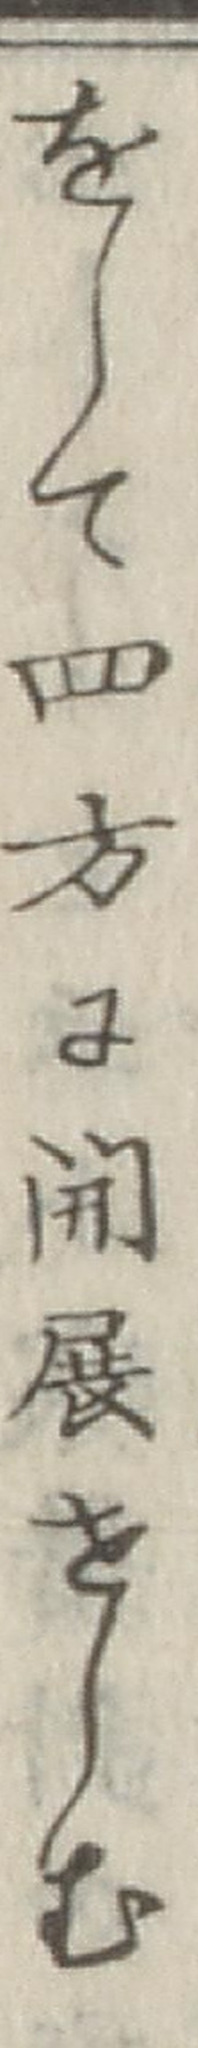をして四方に開展せしむ
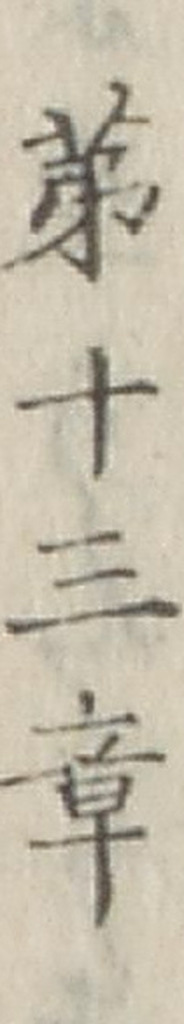第十三章
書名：訓蒙　天然地理學　中
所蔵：東京大学地震研究所図書室 Earthquake Research Institute Library, The University of Tokyo, JAPAN
